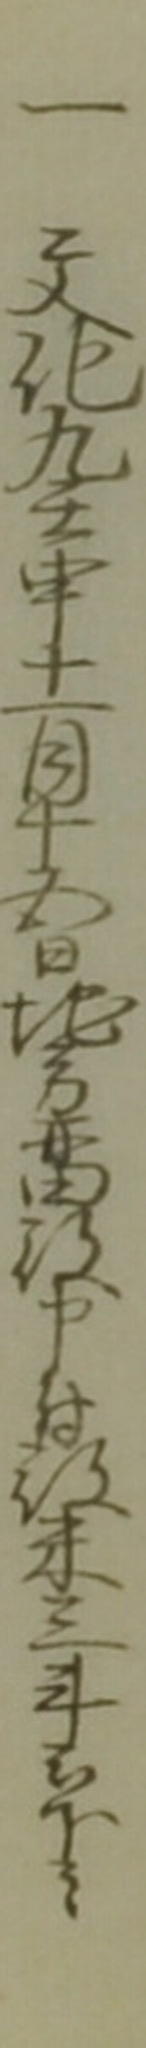一文化九壬申十一月十五日地方留役申付役米三斗被下之
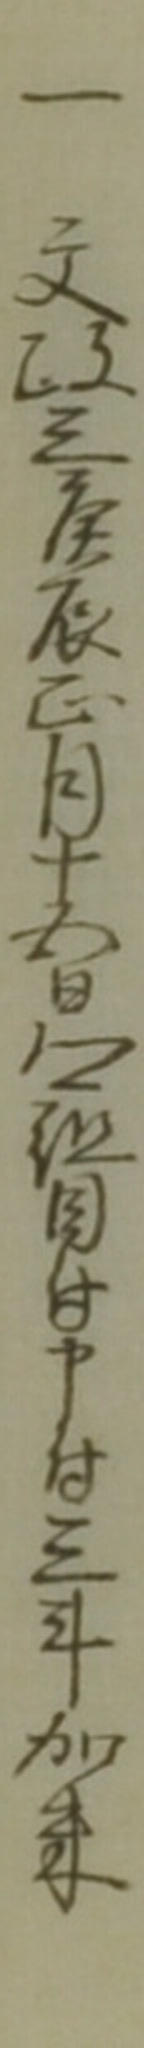一文政三庚辰正月十五日郷組目付申付三斗加米
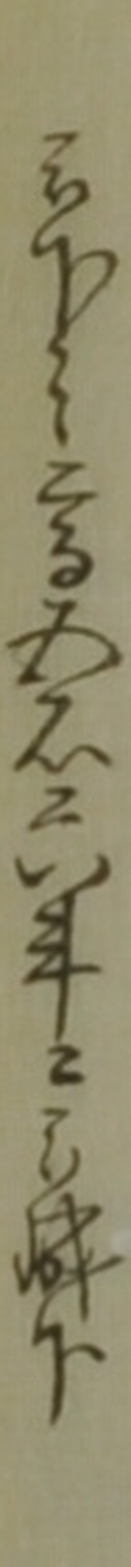被下之高五石六斗ニ被成下
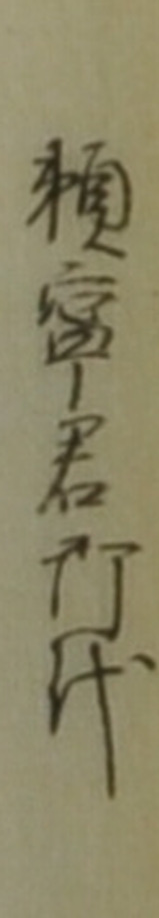頼寧君御代
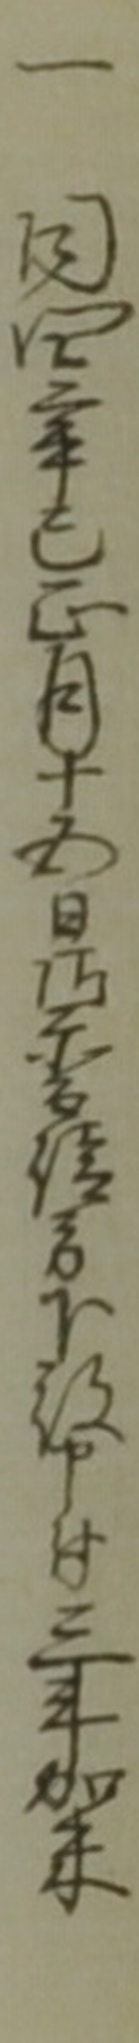一同四辛巳正月十五日御普請方下役申付三斗加米
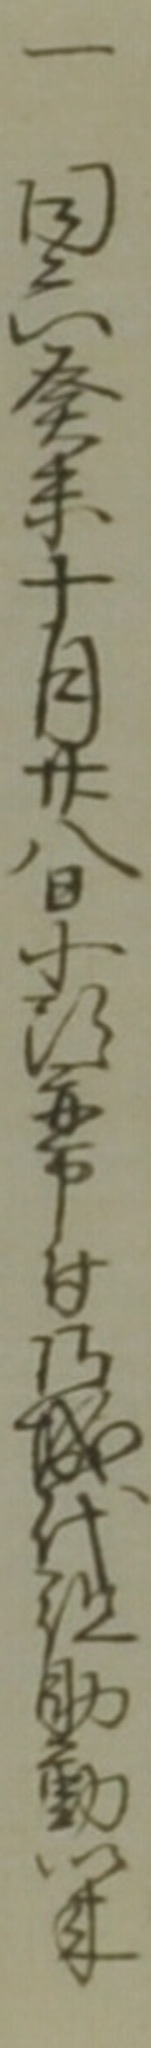一同六癸未十月廿八日小頭並申付御城代組助勤以来
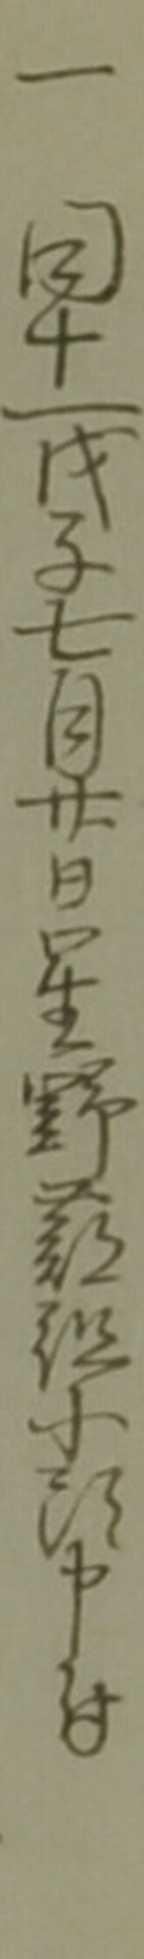一同十一戊子七月廿日星野蔀組小頭申付
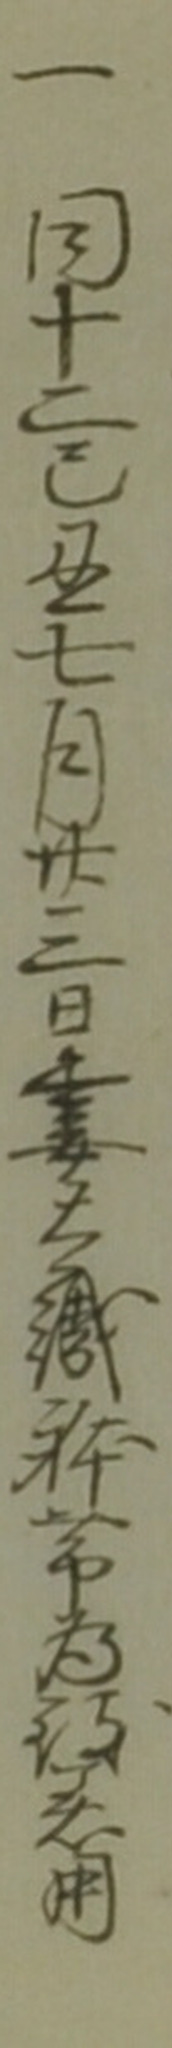一同十二巳丑七月廿三日妻大織躰帯為致着用
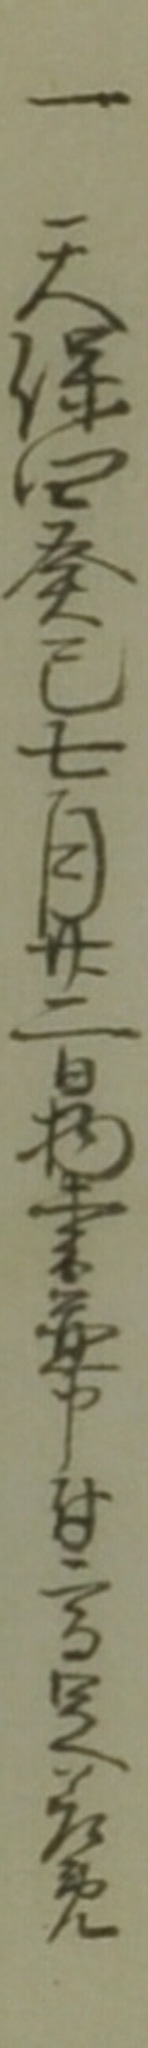一天保四癸巳七月廿二日物書帯申付高足差免
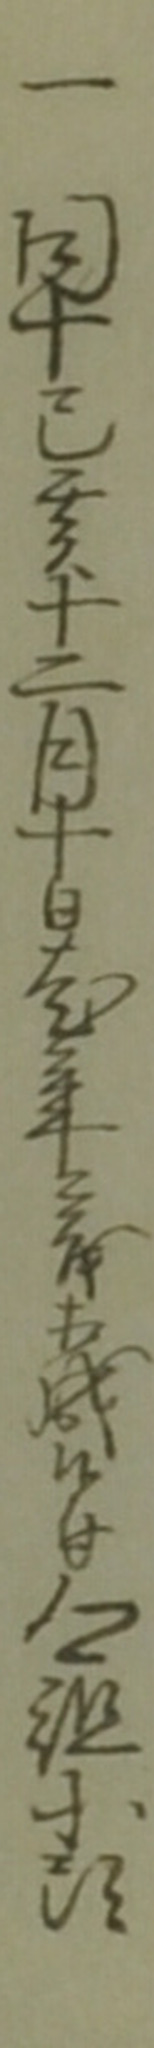一同十己亥十二月十日老年茂相成候付郷組小頭
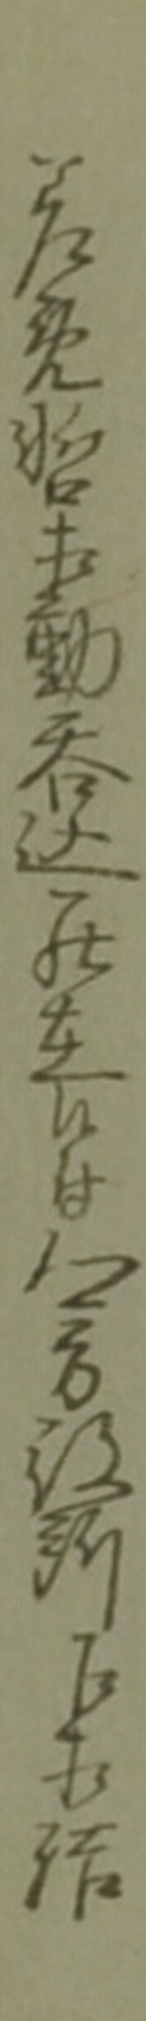差免暫相勤呑込罷在候付郷組役所江相詰
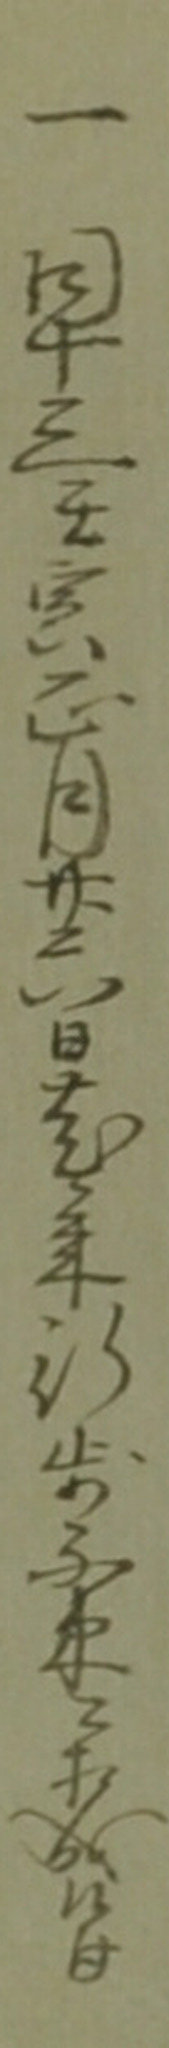一同十三壬寅正月廿六日老年行歩不束ニ相成候付
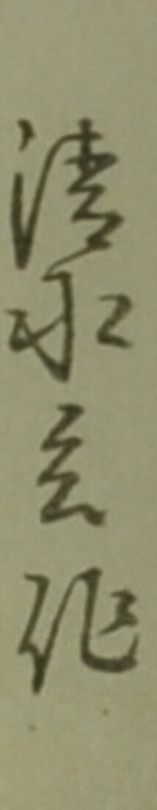清水玄作

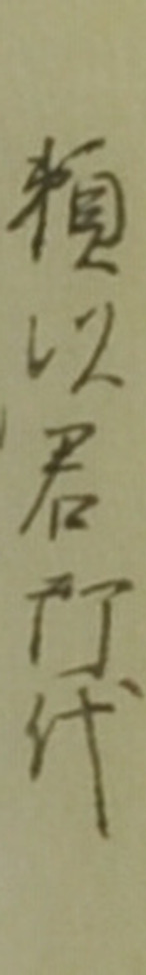頼以君御代
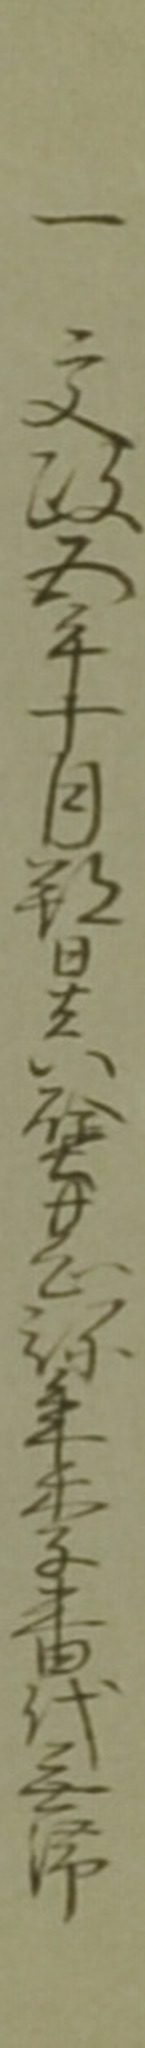一文政五午十月朔日真壁甚年季番代無滞
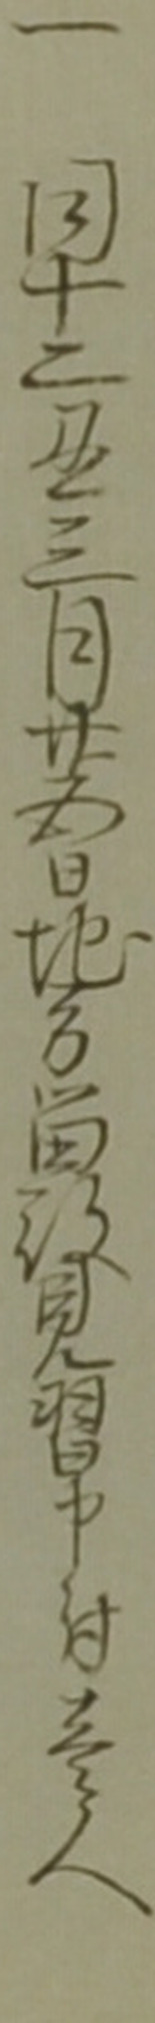一同十二丑三月廿五日地方留役見習申付壱人
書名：無足諸士勤仕録（八）
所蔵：伊那市立高遠町図書館・合同会社AMANE
